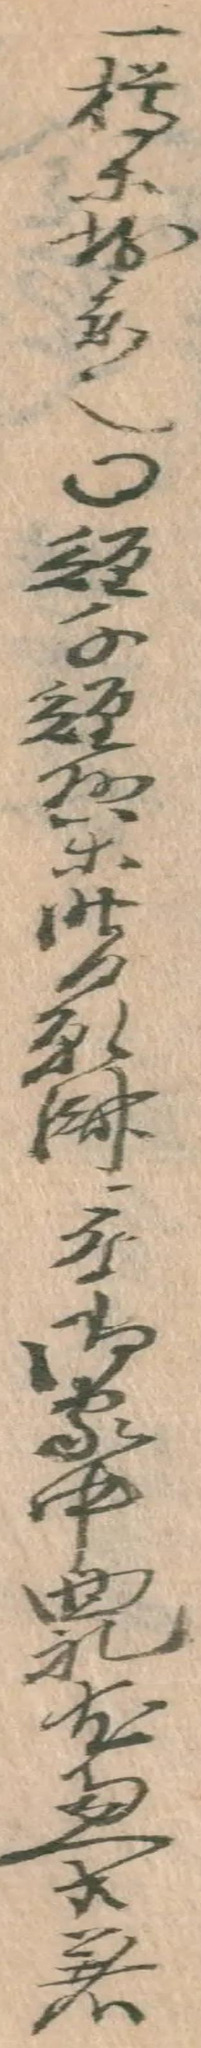一樽等持参也○経千経啓等昨日願済ニ付御家中回礼尤両人共着
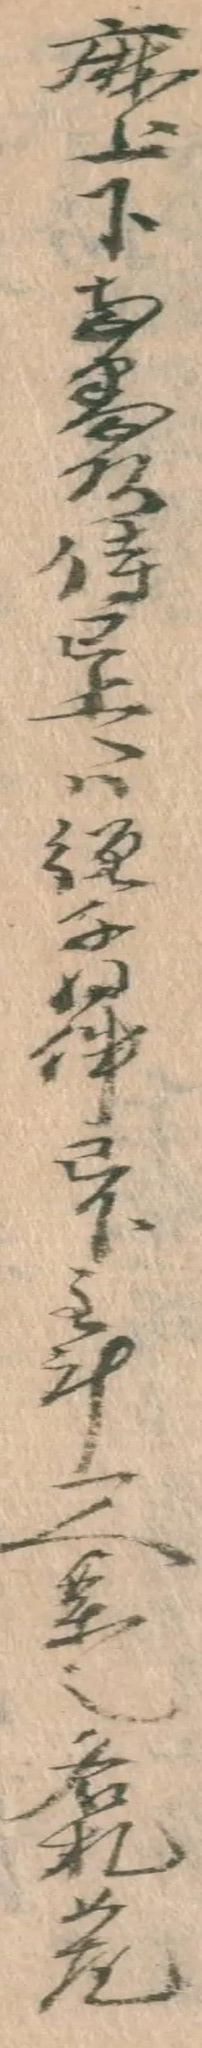麻上下両番頭侍已上へハ経千同伴已下主斗一人参也各札如左
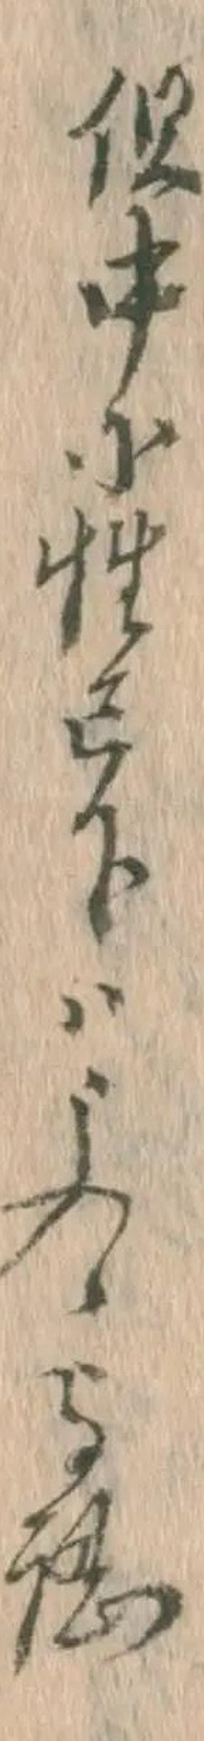但中小姓已下ハ申入候と認
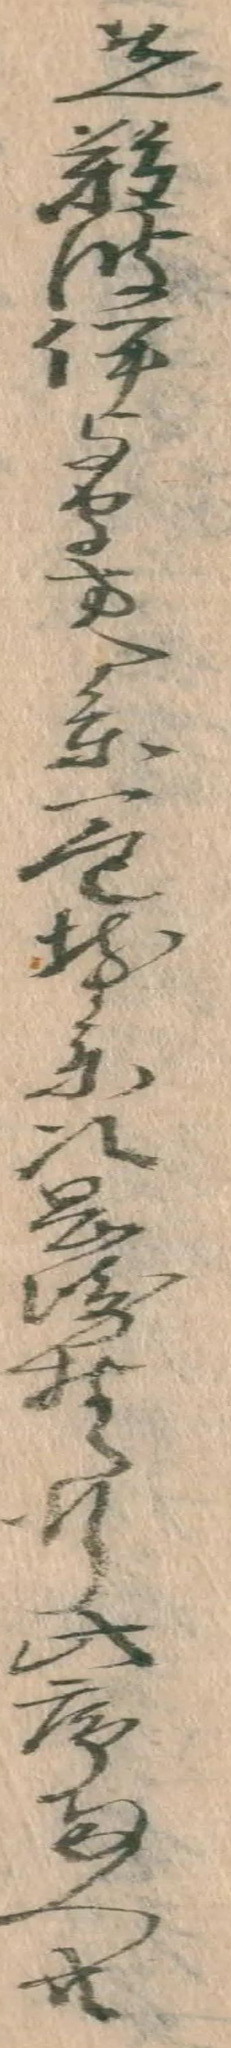先難波伊与守方へ参一包持参次岡崎村へ行此序両人共
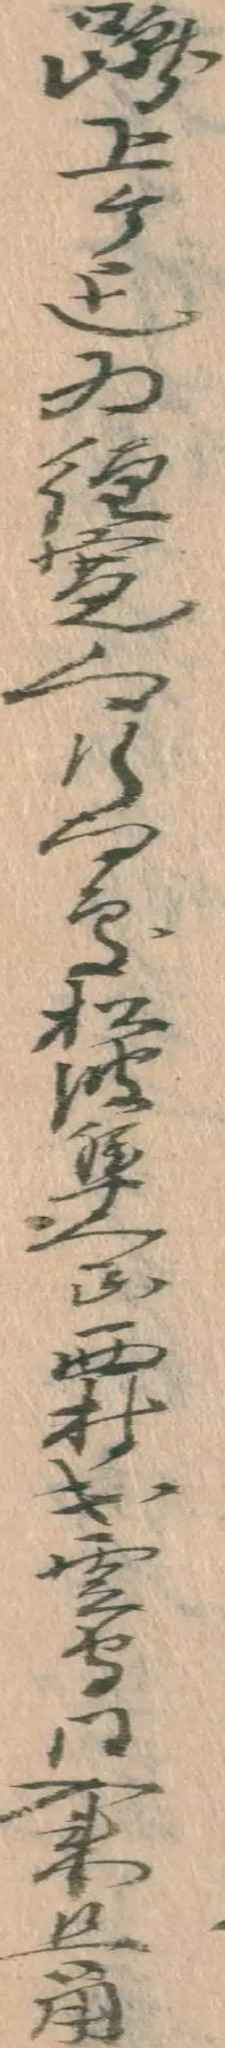蹴上ケ迄為経寛向引向處松波隼人正西村出雲守同入来且角
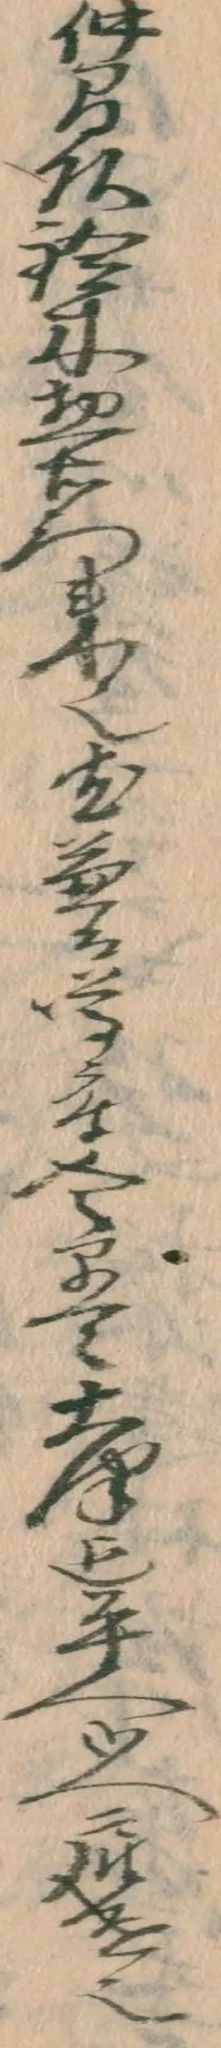仲間頭鈴木惣右衛門来也尤兼而噂ニ付今早馬大津迄平人弐人雇遣也
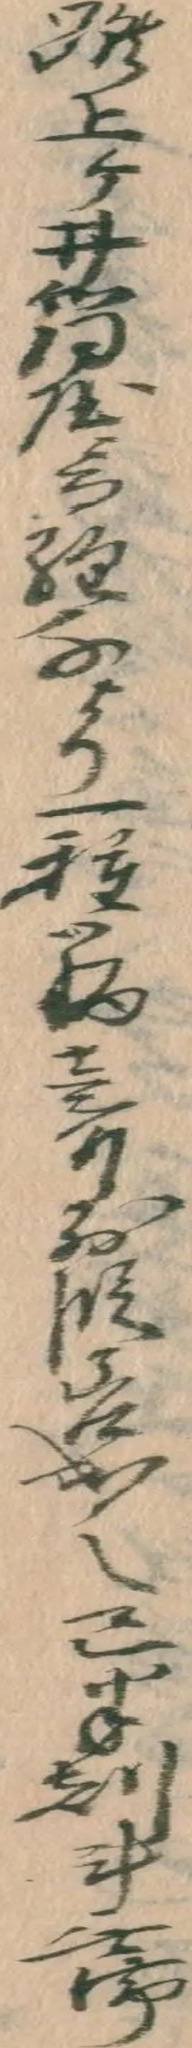蹴上ケ井筒屋ニ而経千より一種御酒一升出段差出也巳半刻斗無滞
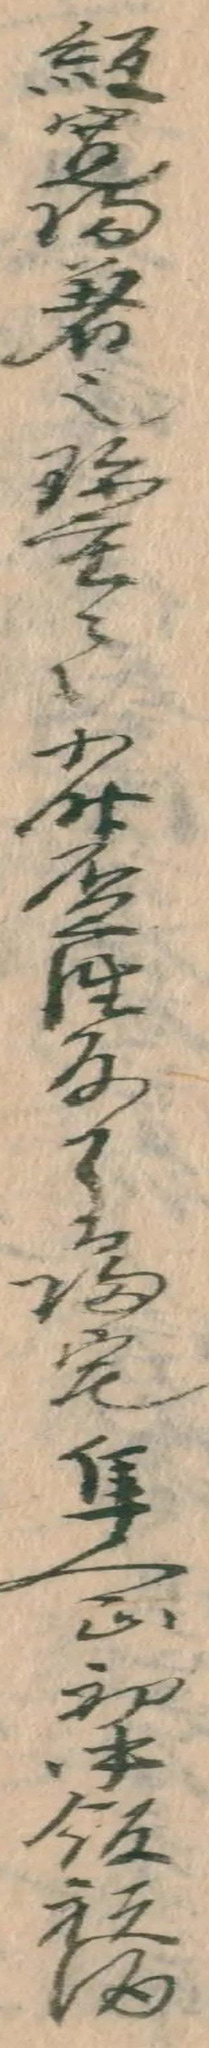経寛帰着也珍重々々小時盃往有了而帰宅隼人正初中飯祝酒
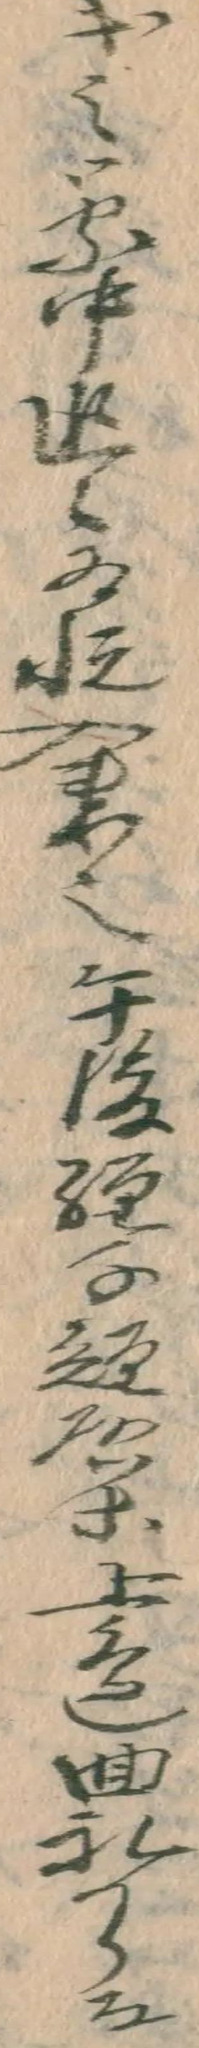出之御家中追々為祝入来也午後経千経啓等上邊回礼了而
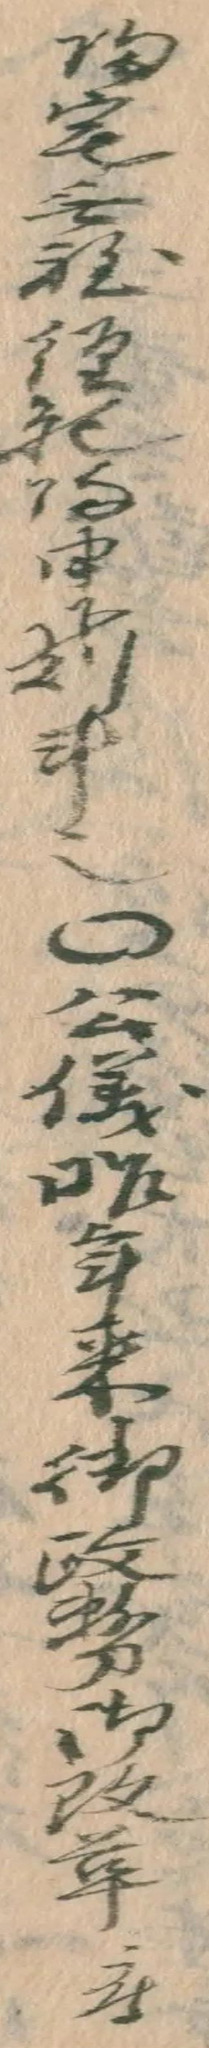帰宅無程経紀帰申下刻斗也〇公儀昨年来御政務御改革ニ付
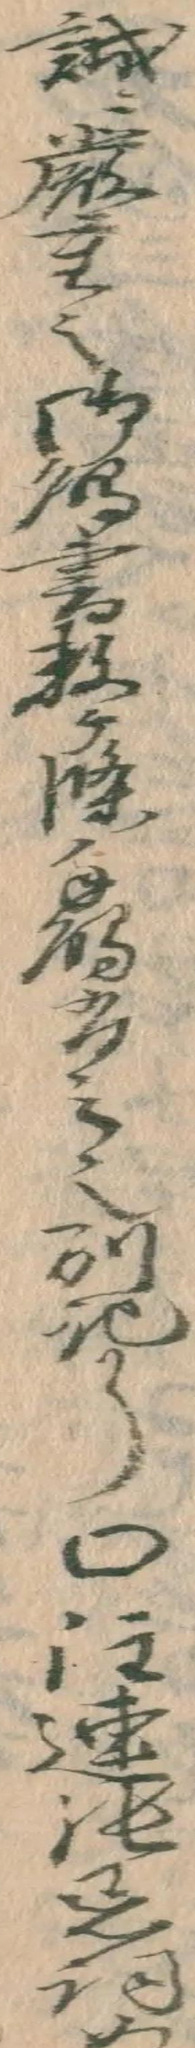誠ニ厳重之御觸書数ケ條手觸有之也別記了○注連張忌詞如例也
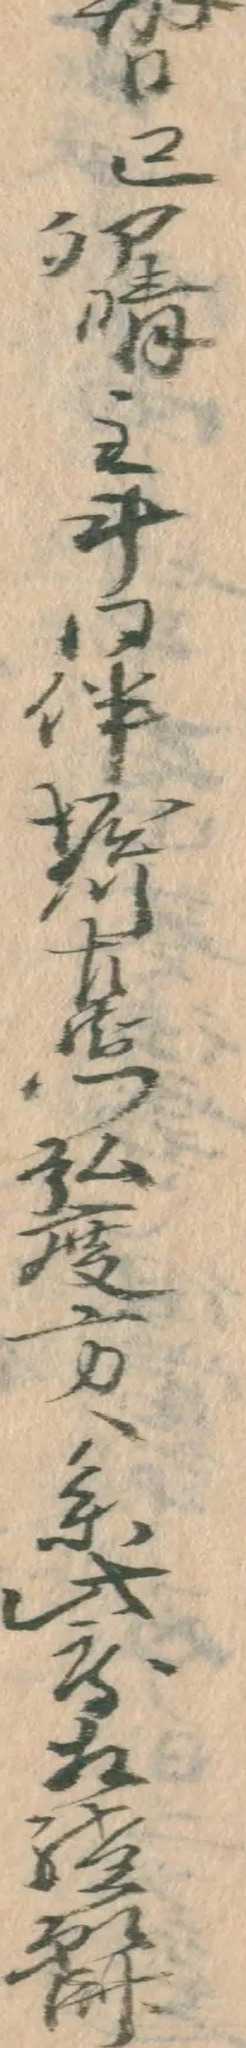朔日巳卯晴主斗同伴堀川左衛門弘度方へ参此度相續願済
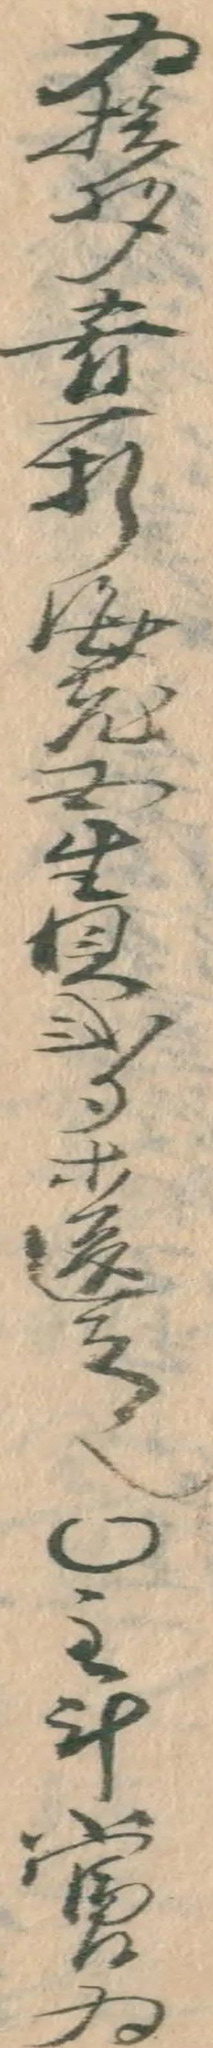為挨拶肴一折海老五生貝弐つ等送之也○主斗當日為
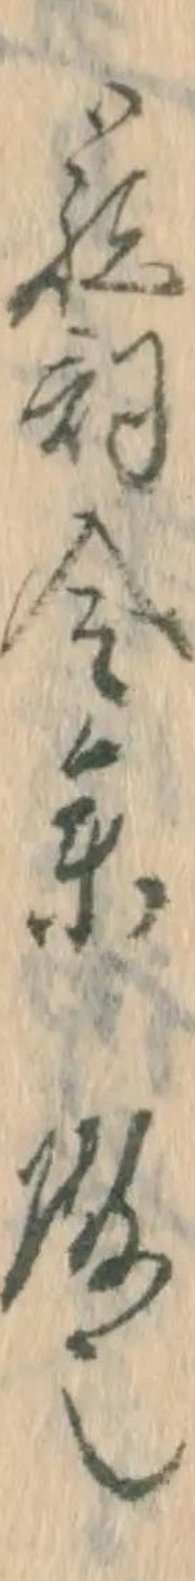御祝詞令参殿也
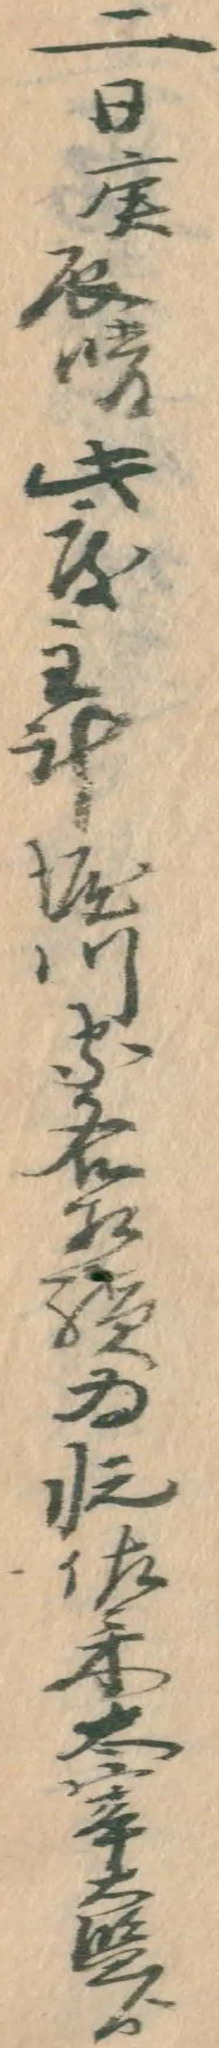二日庚辰晴此度主斗堀川家名相續為祝佐々木太宰大監ゟ

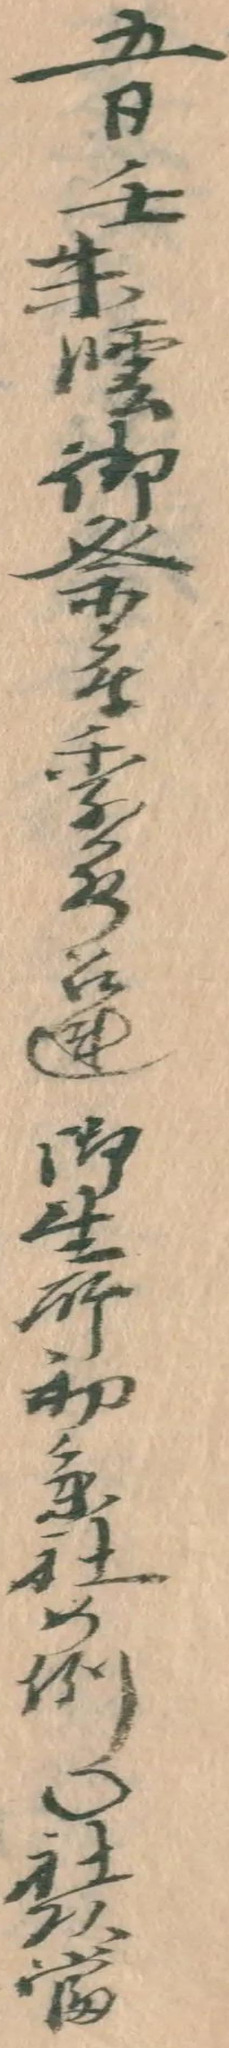五日壬未曇御祭ニ付季若召御生所初参社如例〇社頭當
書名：賀茂社記録. 第69冊
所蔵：国立国会図書館 National Diet Library, JAPAN
